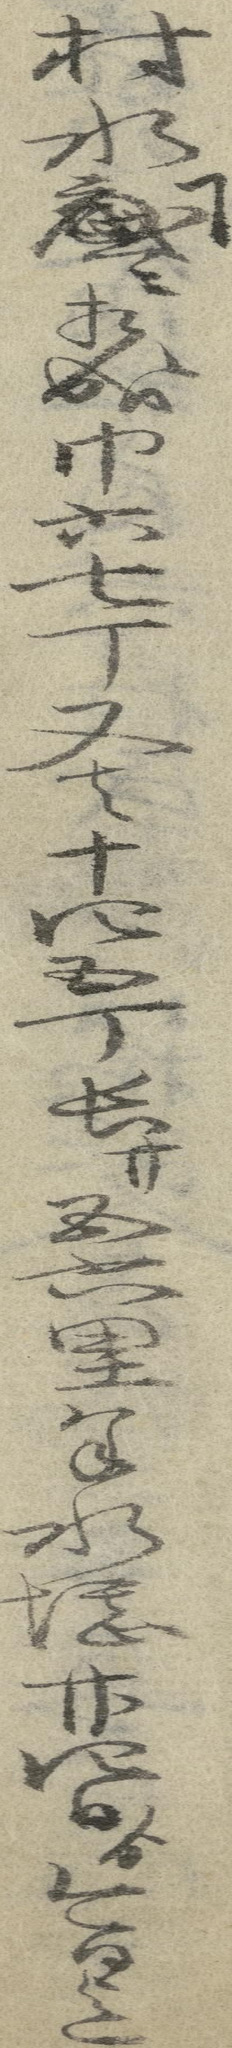村水下ニ相成巾六七丁又者十四五丁長サ五六里半水堪廿四日ゟ
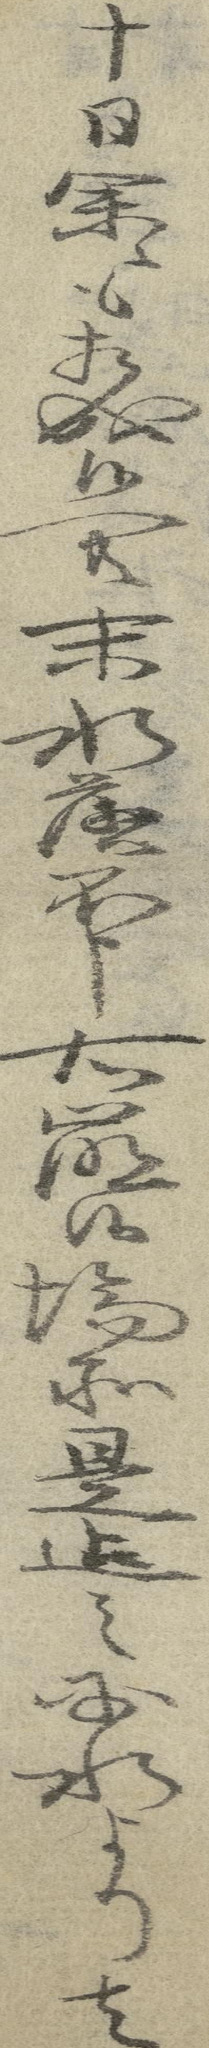十日余ニも相成候へ共末水廣不申右崩候場所是迠之平水より者
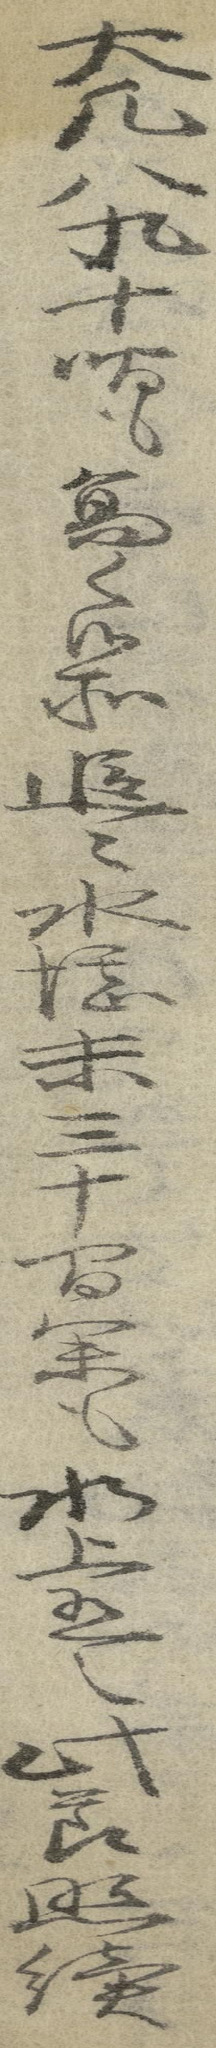大凡八九十間も高く候所追々水湛未三十間余も水上有之此節照續
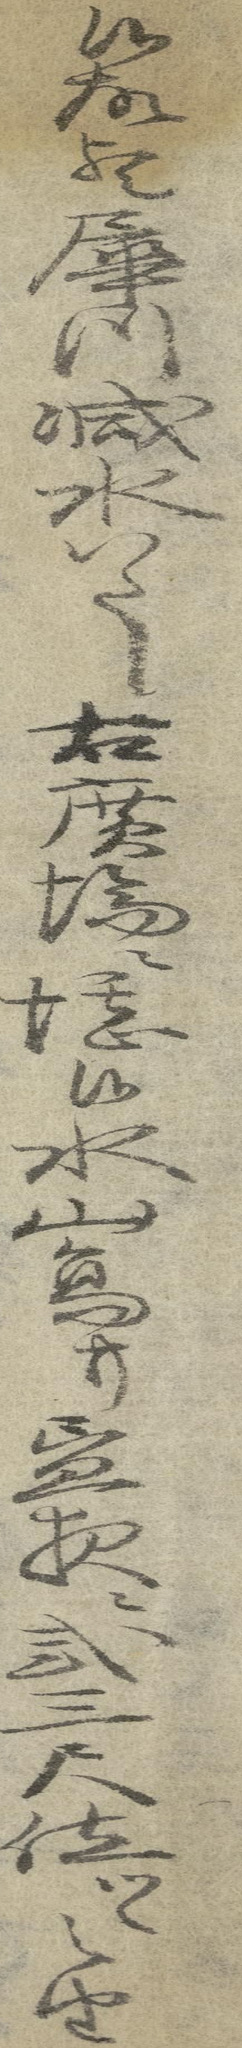候故歟犀川減水いたし右廣場ニ堪候水山高サ昼夜ニ弐三尺位ツゝ之由
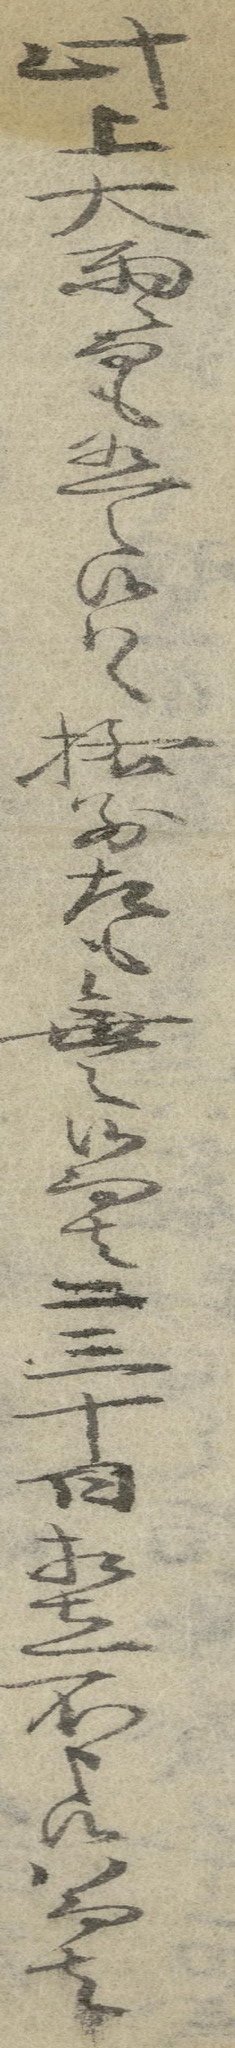此上大雨ニ而も有之候ハゝ格別左も無之候而者二三十日相立不申候ハ而者
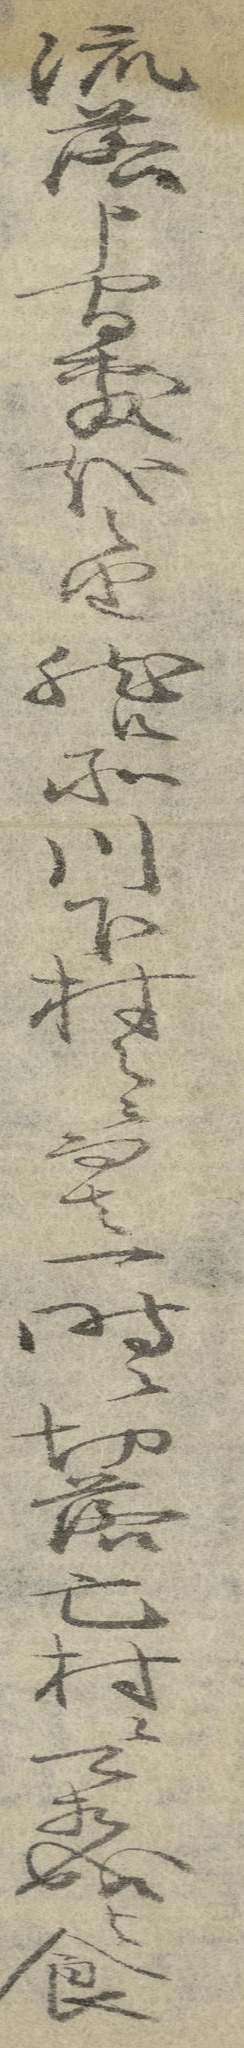流落申間敷赴之由然ル所川下村ゝニ而者一時ニ切落亡村ニ可相成と食
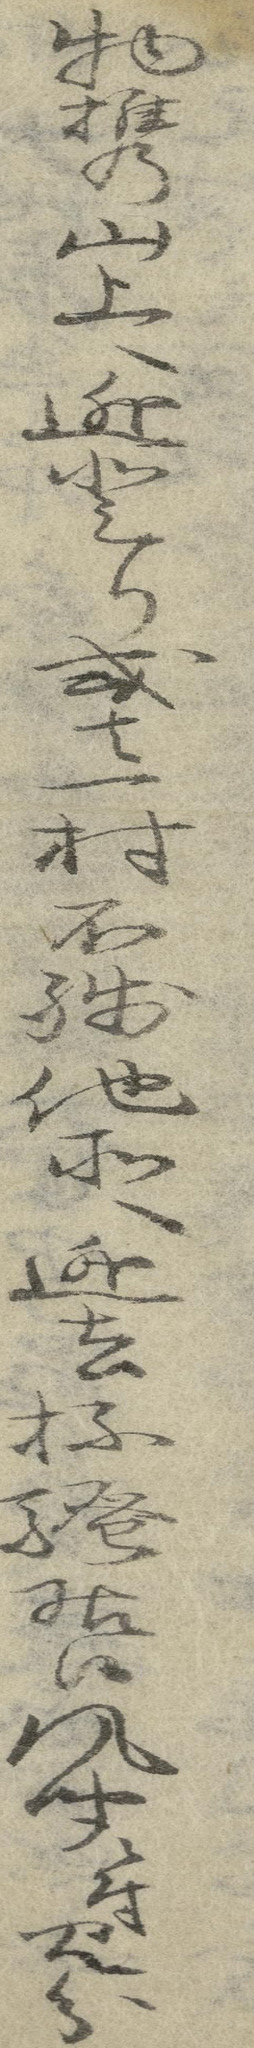物携山上へ逃登り或者一村不残他所へ逃去抔騒然候風聞ニ付見分
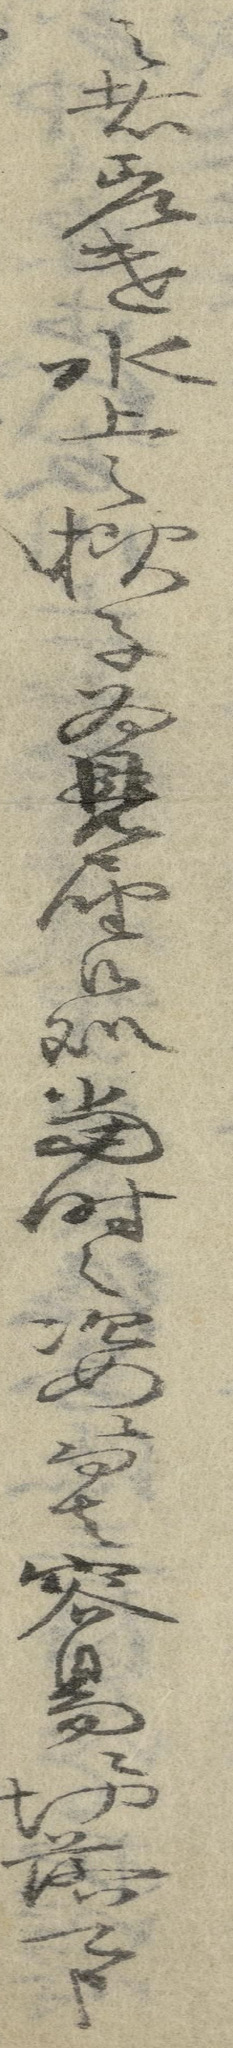之者差遣水上之様子為見届候処當時之姿ニ而者容易ニ切落可申
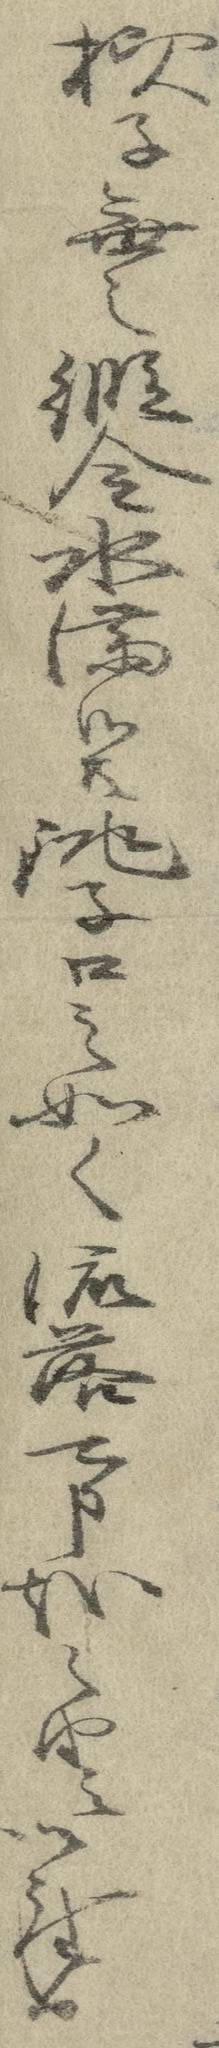様子無之縦令令水漏候共銚子口之如く流落可申哉之由ニ御座候
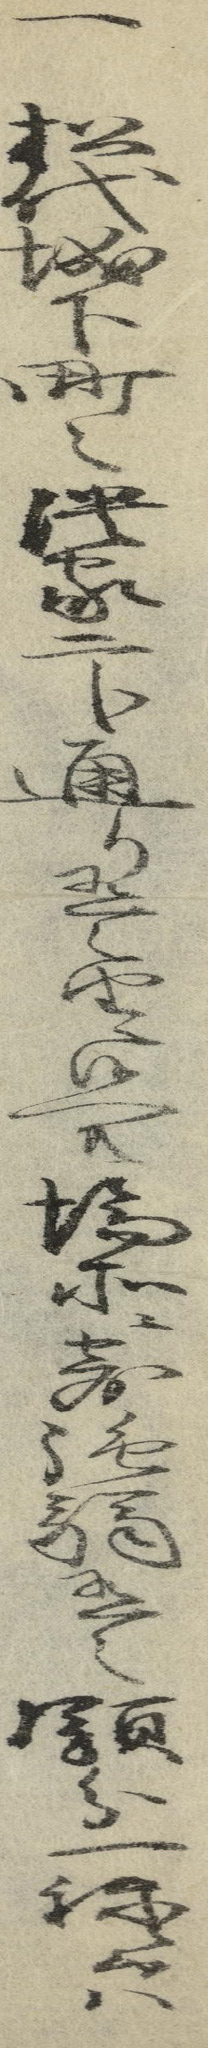一松代城下町之潰家二分通り有由二候へ共場所ニ寄強弱有之領分一躰ニ而ハ
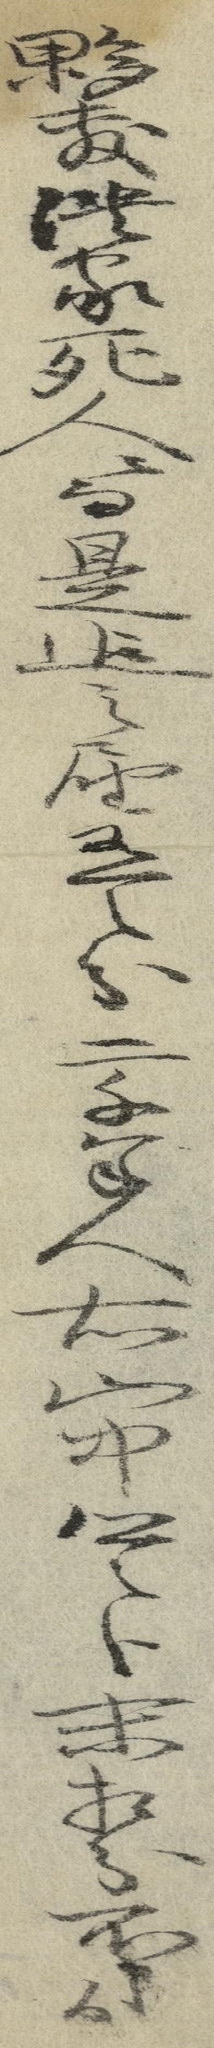夥敷潰家死人二而是迄之届有之分二千余人右山中郷之分未相分不申候
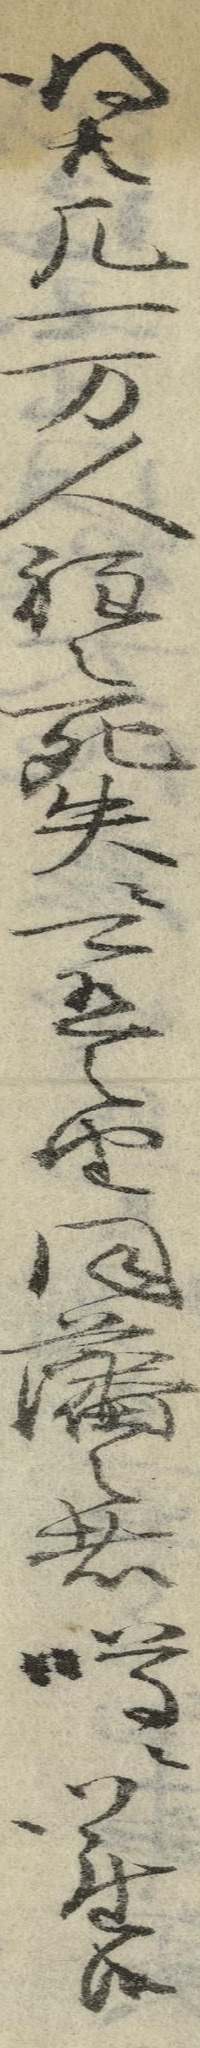得共凡一万人程之死失ニ可有之由同藩之者噂ニ御座候
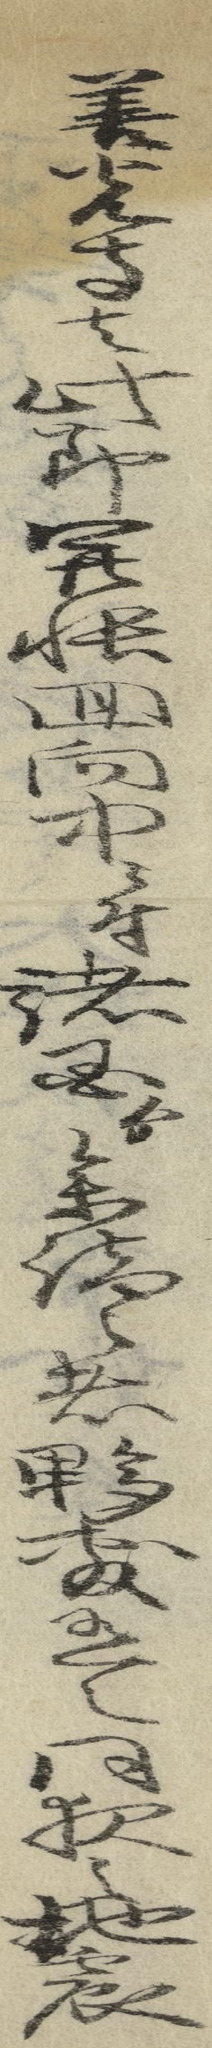一善光寺者此節開帳回向中ニ付諸国ゟ参詣之者夥敷有之同夜之地震
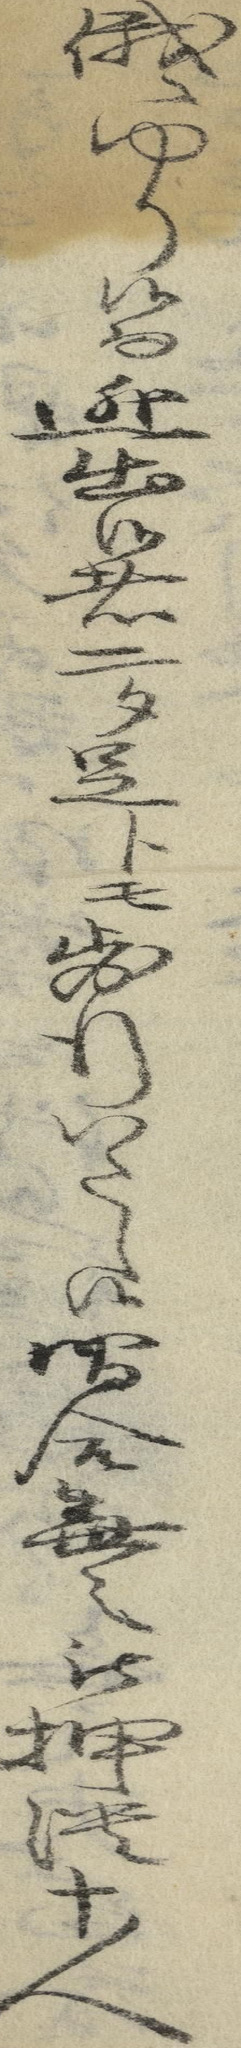俄ニゆり候而逃出候者ニタ足分モ歩行いたし候間合無之被押潰十人
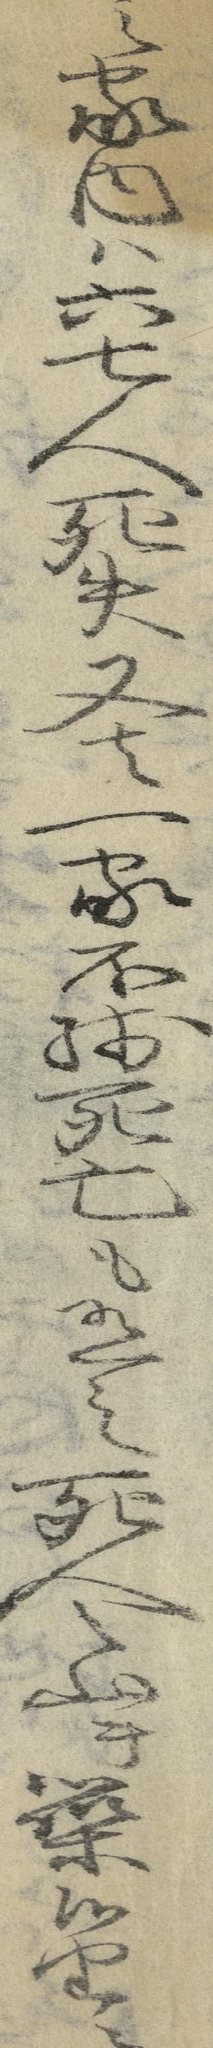之家内ハ六七人死失又者一家不残死亡も有之死人之山ヲ築候由ニ
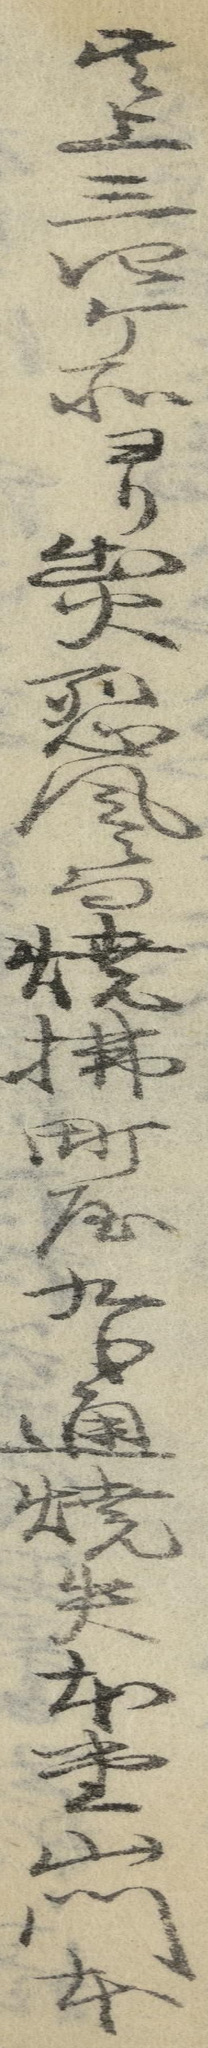其上三四ヶ所ヨリ出火烈風ニ而焼拂町屋九分通消失本堂山門本
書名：[善光寺地震被害書上]
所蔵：東京大学地震研究所図書室 Earthquake Research Institute Library, The University of Tokyo, JAPAN
